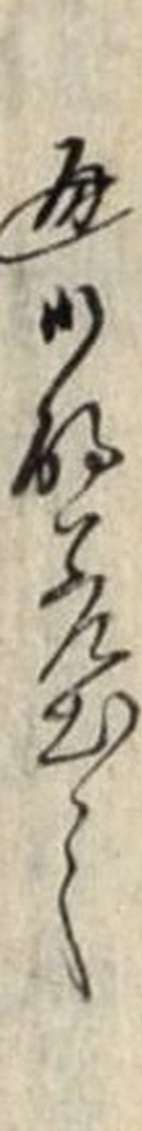通御触差出之
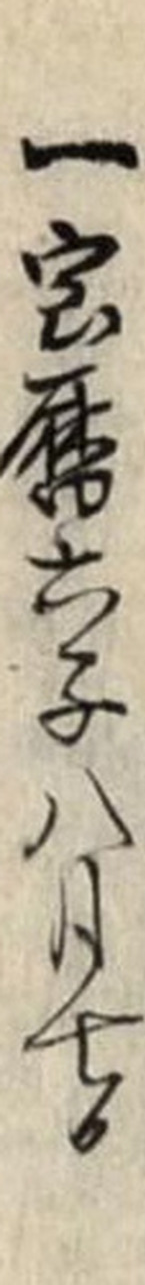一宝暦六子八月七日
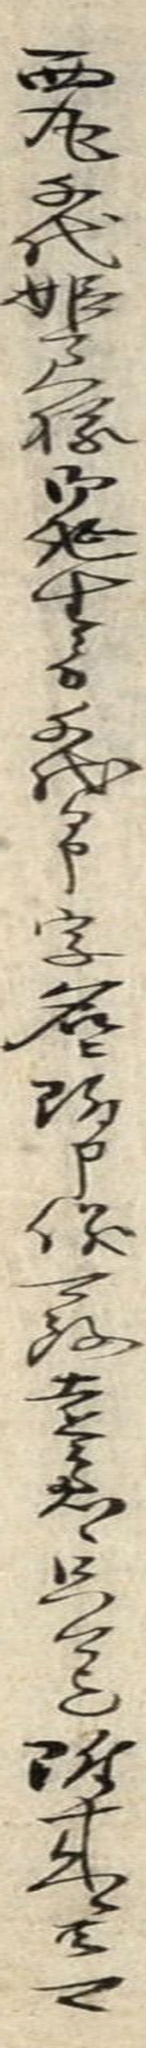西丸千代姫君様御誕生に付千代と申字名に附申儀可致遠慮候只今迄附来候共可
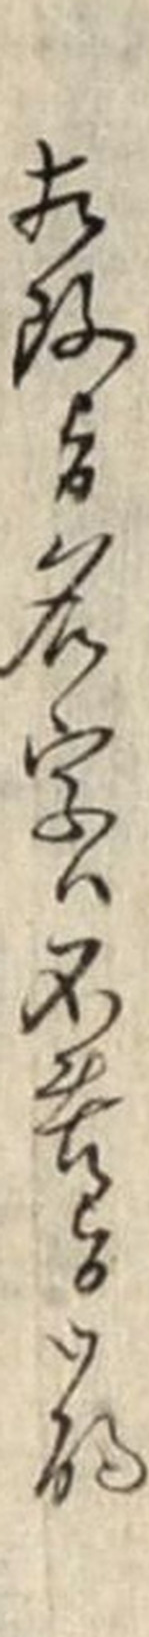相改候旨名字は不苦旨御触
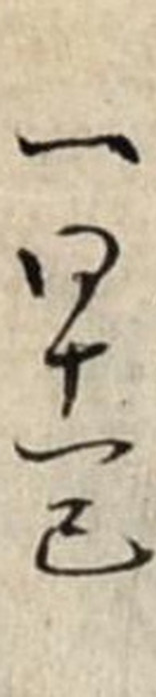一同十一己
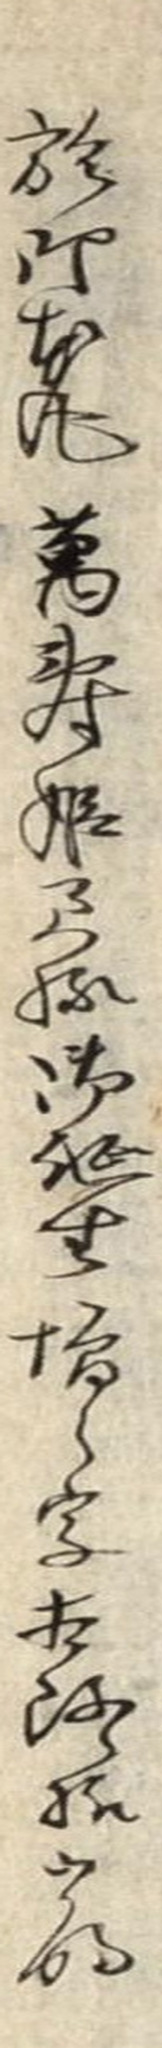於御本丸萬寿姫君様御誕生増之字相改候様御触

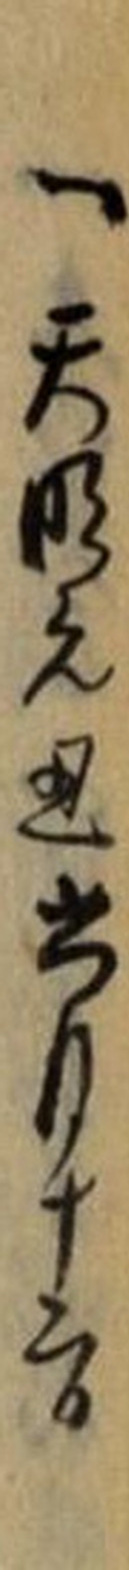一天明元丑六月十二日
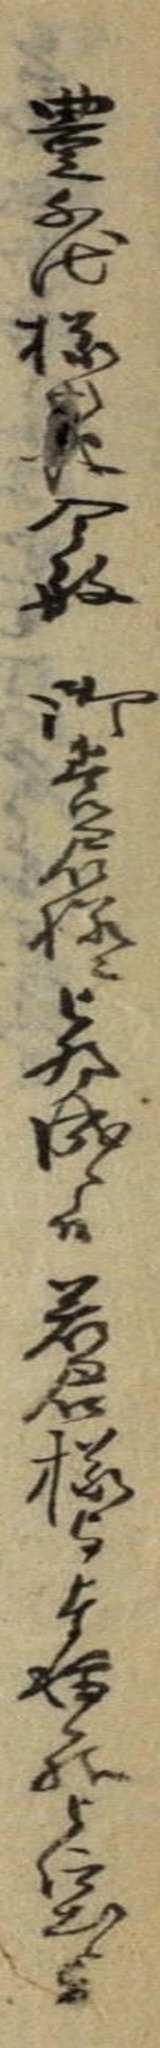豊千代様御儀今般御養君様に被為成候に付若君様と奉称候様被仰出候旨
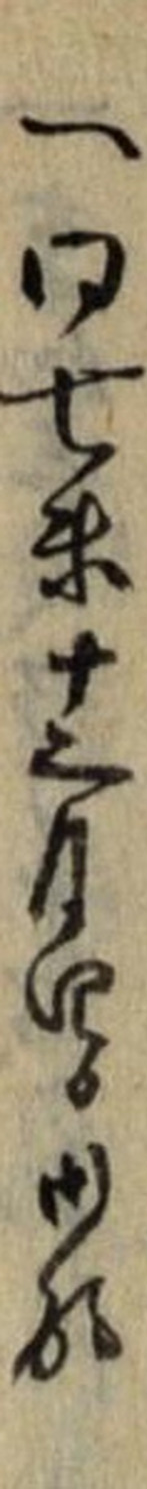一同七未十二月四日御触
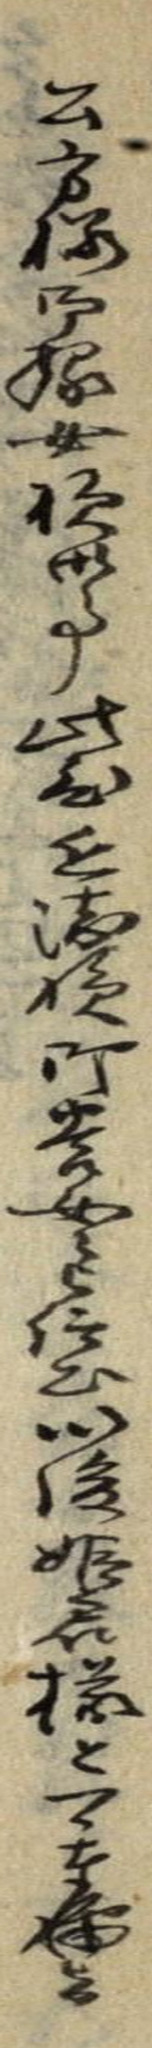公方様御縁女様御事此度近衛様御養女に被仰出以後姫君様と可奉称旨
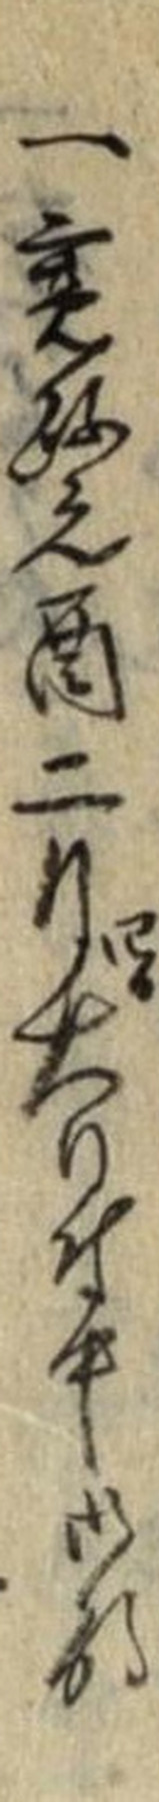一寛政元酉二月四日大目付中御触
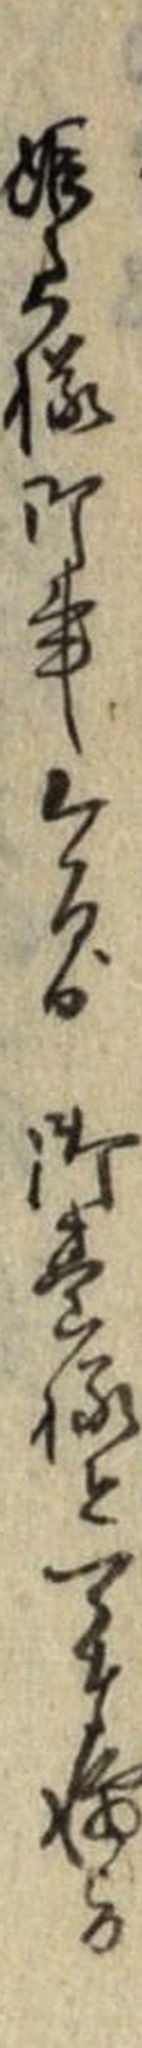姫君様御事今日ゟ御台様と可奉称候旨
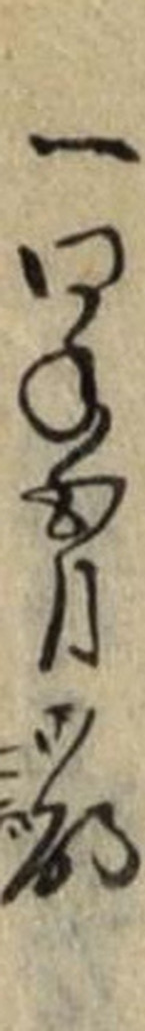一同年五月御触
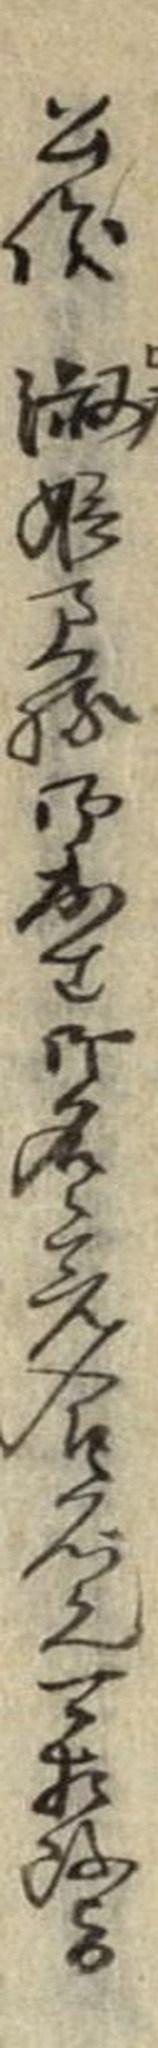公儀淑姫君様御誕生御名に差合候名元可相改旨
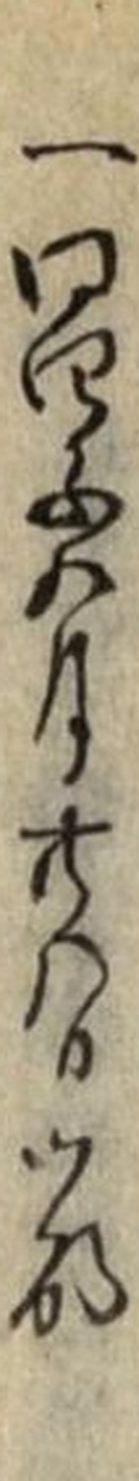一同四子八月廿八日御触
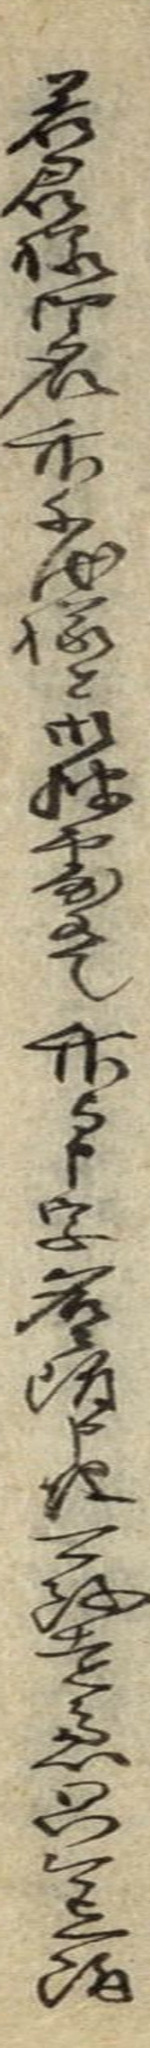若君様御名竹千代様と御披露有之竹と申字名に附申儀可致遠慮只今迄附
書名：蒐輯之部
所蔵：福井県文書館 Fukui Prefectural Archives
